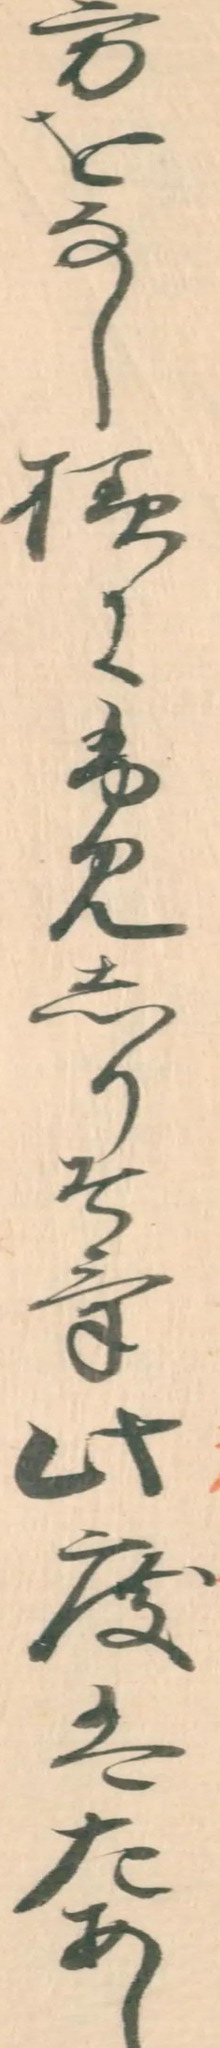方をなし様にふみしりそけ此度は左あし
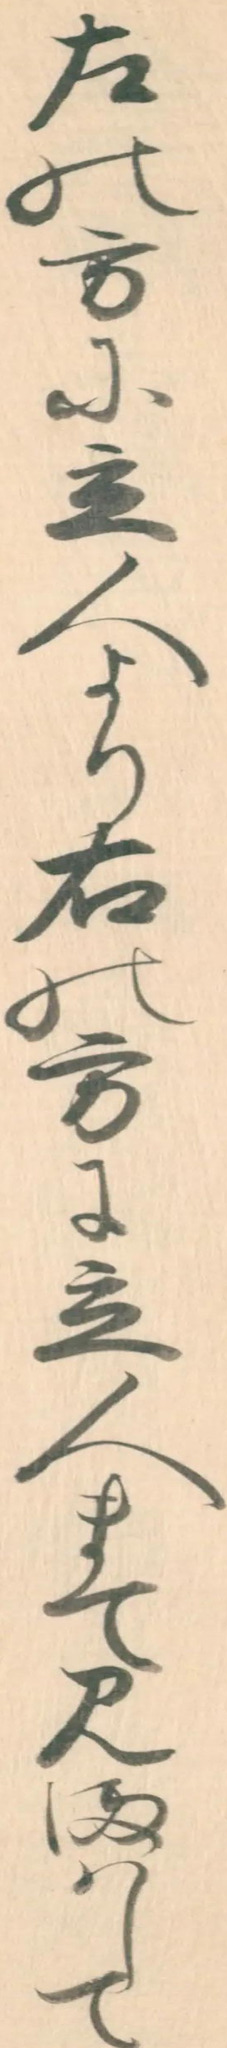左の方に立人より右の方に立人まてみまはして

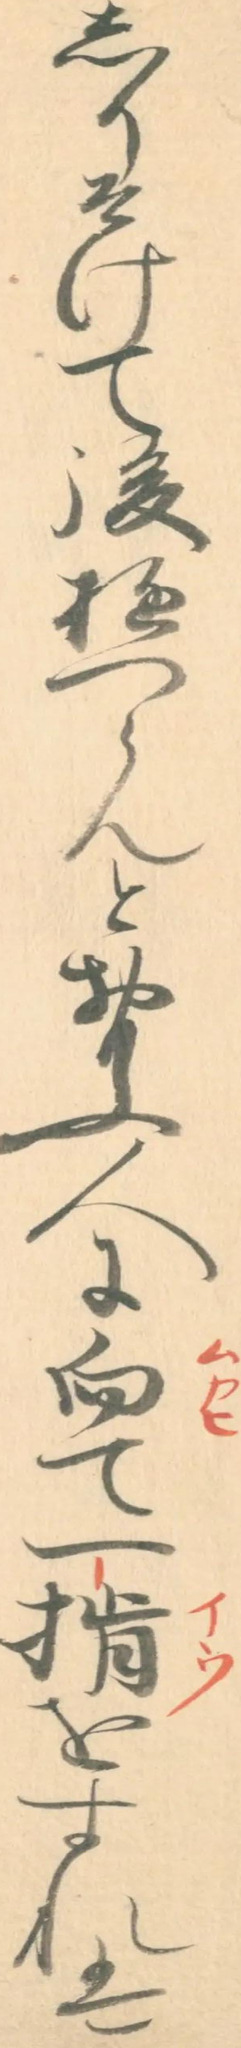しりそけて後ゆつらんとおもふ人に向て一指をすれにて
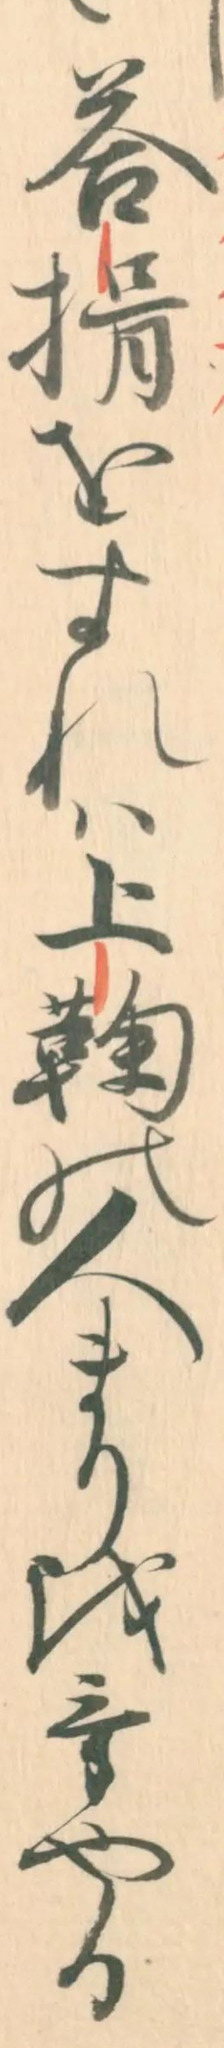楫をすれは上鞠の人もまりをやる
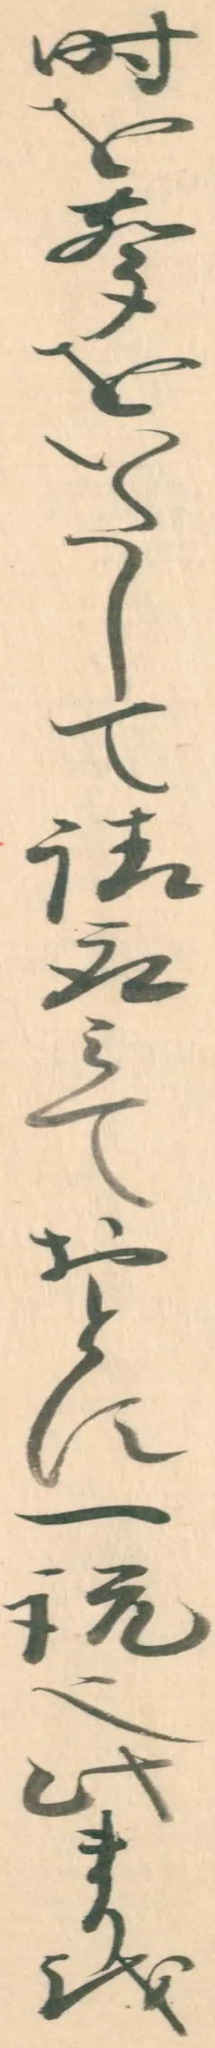時を声をいたして請取みておとす一説也此まりを
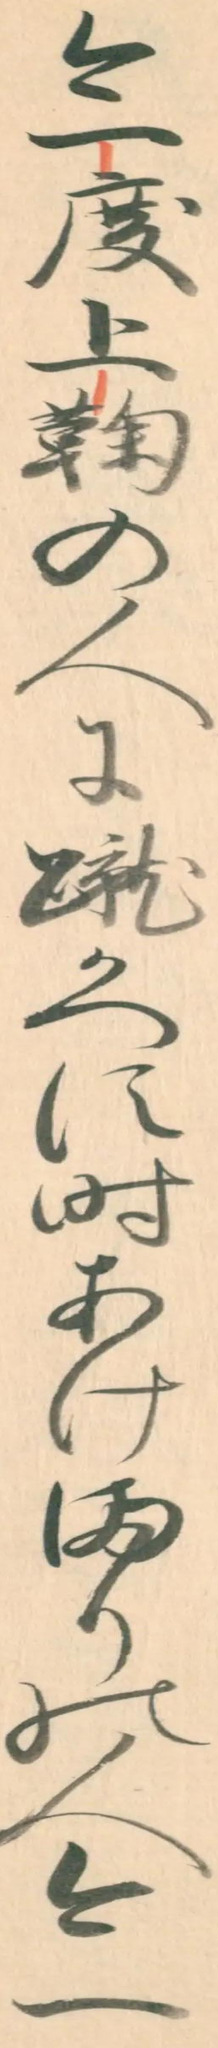今一度上鞠の人に蹴かへす時あけまりの人今一
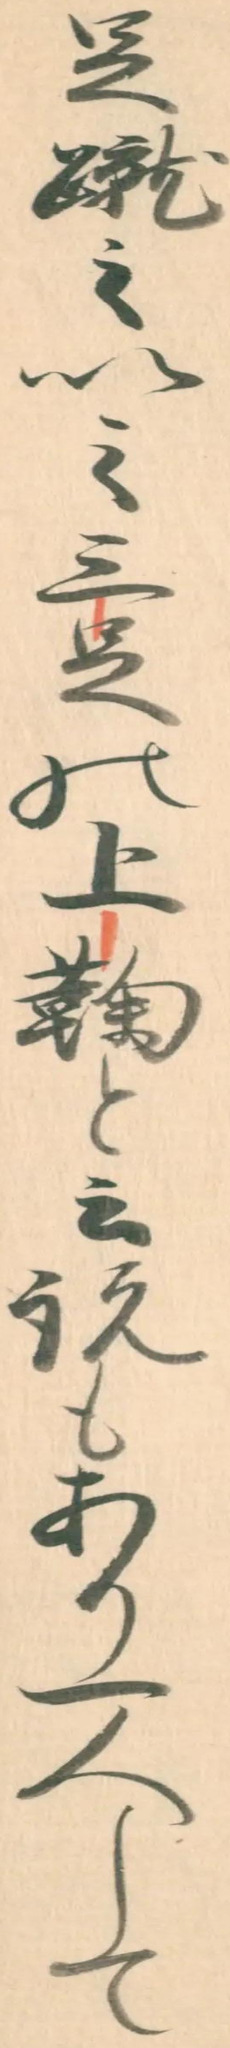度足蹴之以之三足の上鞠と云説もあり一人して
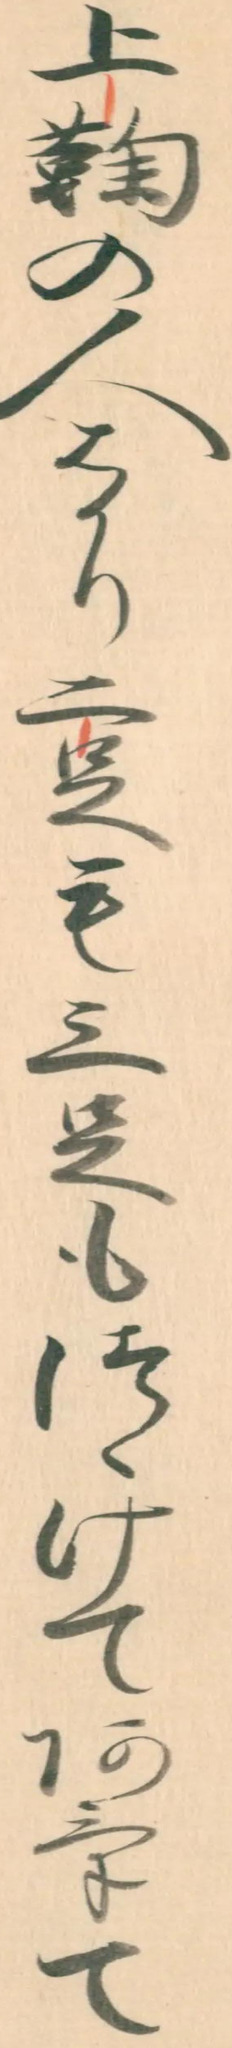上鞠の人はかり二足も三足もつゝけてあけて
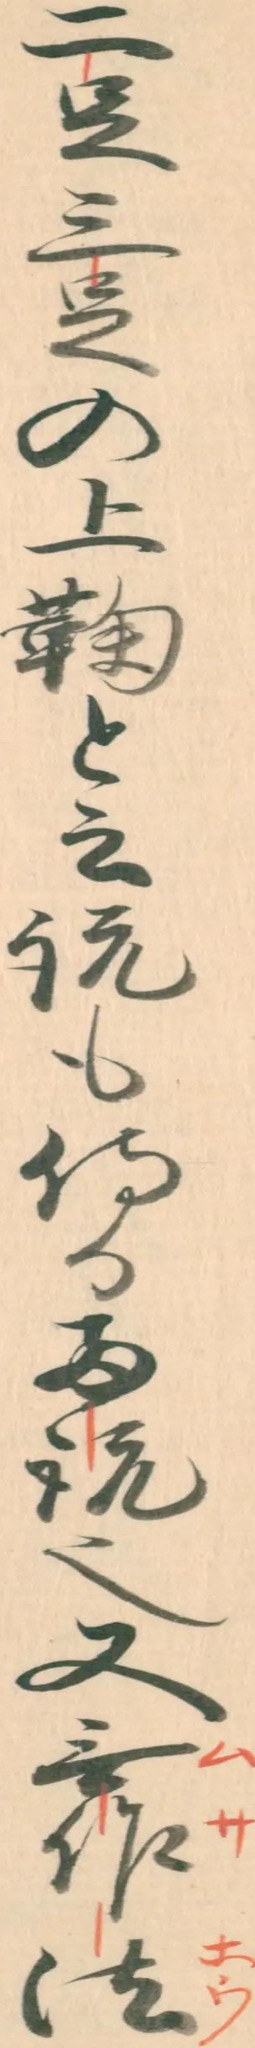二足三足の上鞠と云説も侍る説也又不作法
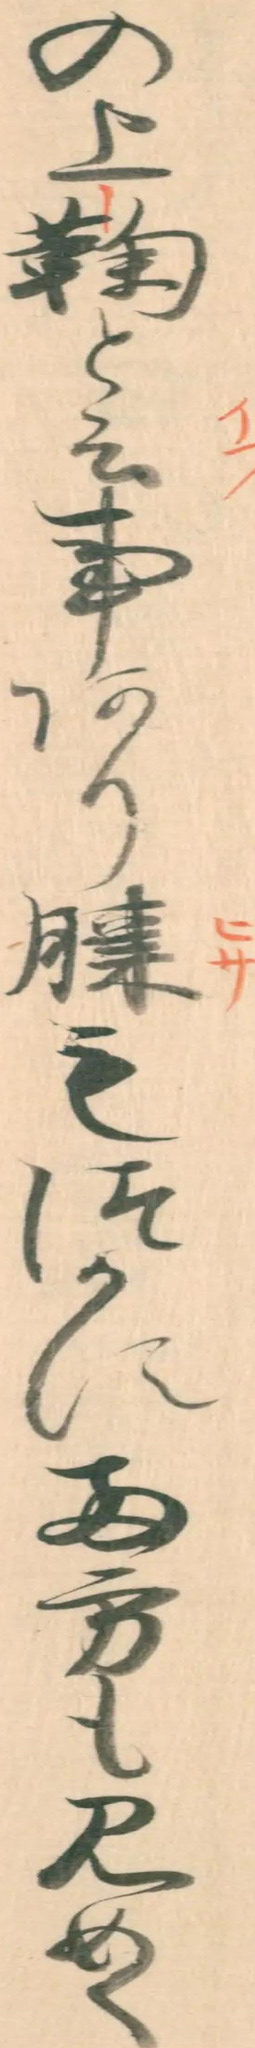の上鞠と云事あり膝もつかす両方もみめゝ
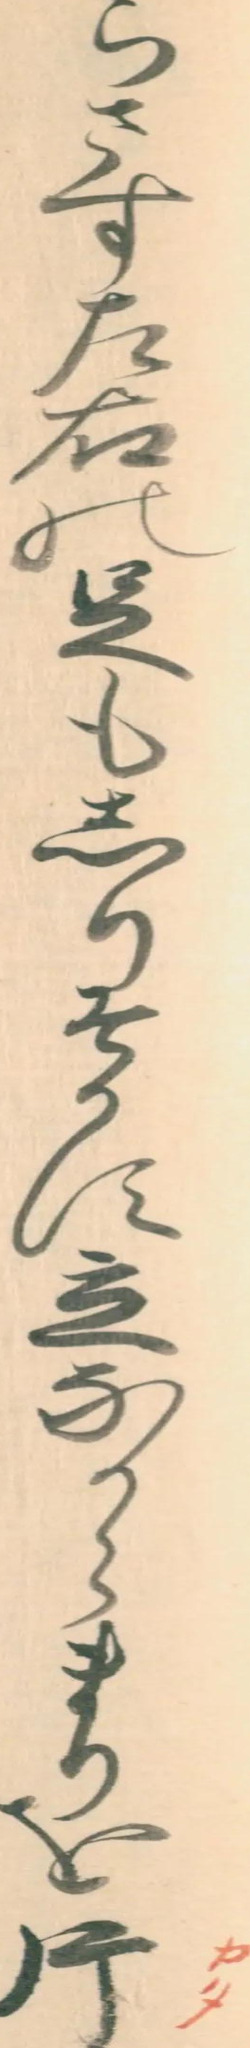らさす左右の足もしりそかす立なからまりを片
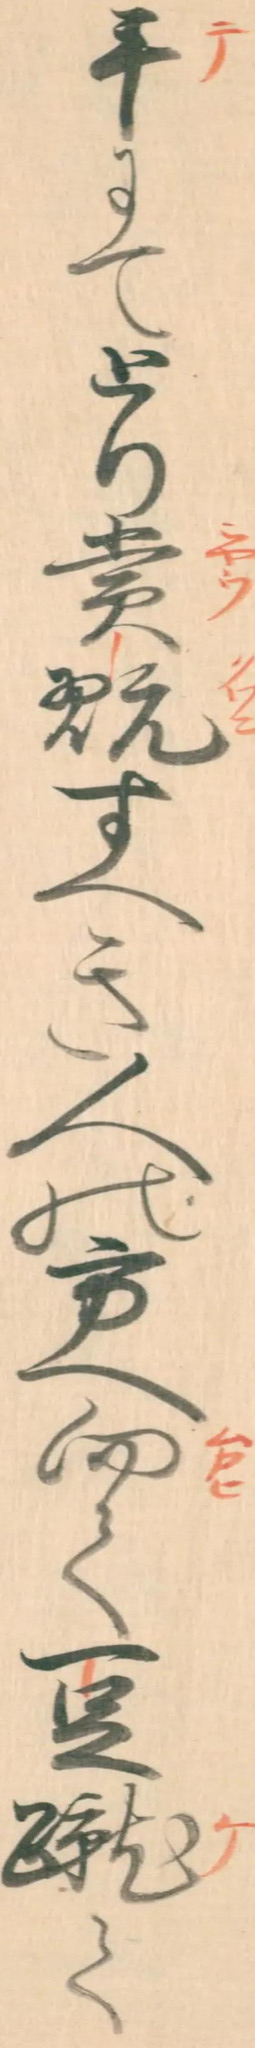手にてとり賞玩すへき人の方へ向て一足蹴て
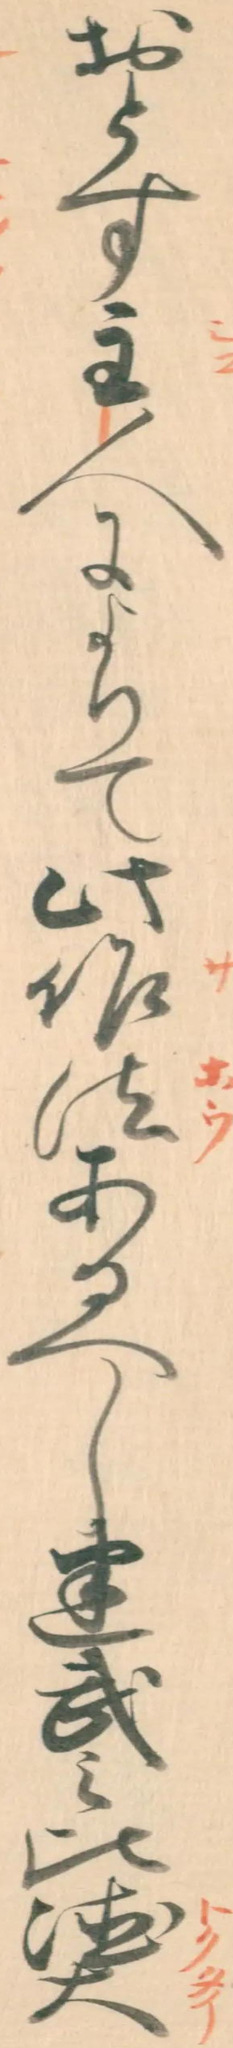おとす主人によりて此作法あるへし建武の頃徳大
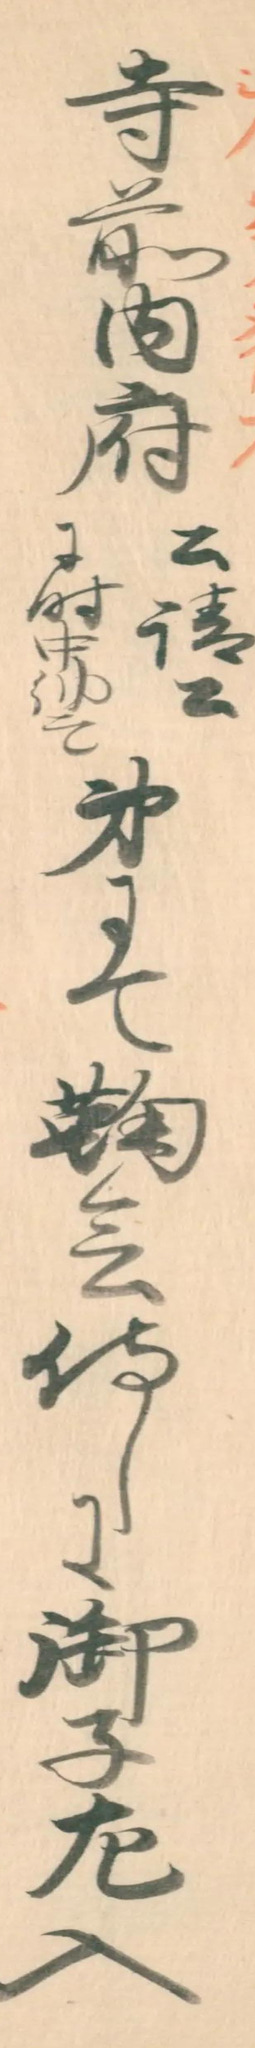寺前内府に時中納第にて鞠侍しに御子左入
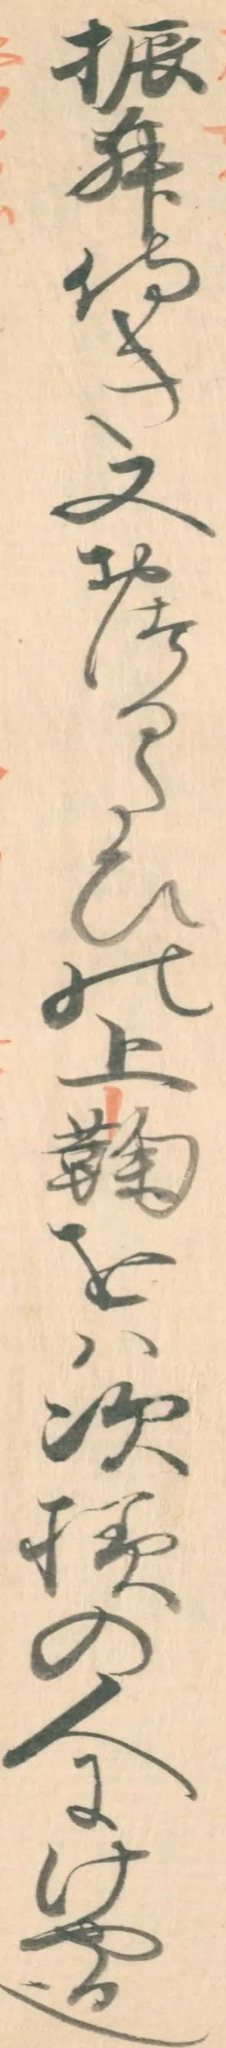振舞侍き又おつるたひの上鞠をは次様の人に蹴やる也
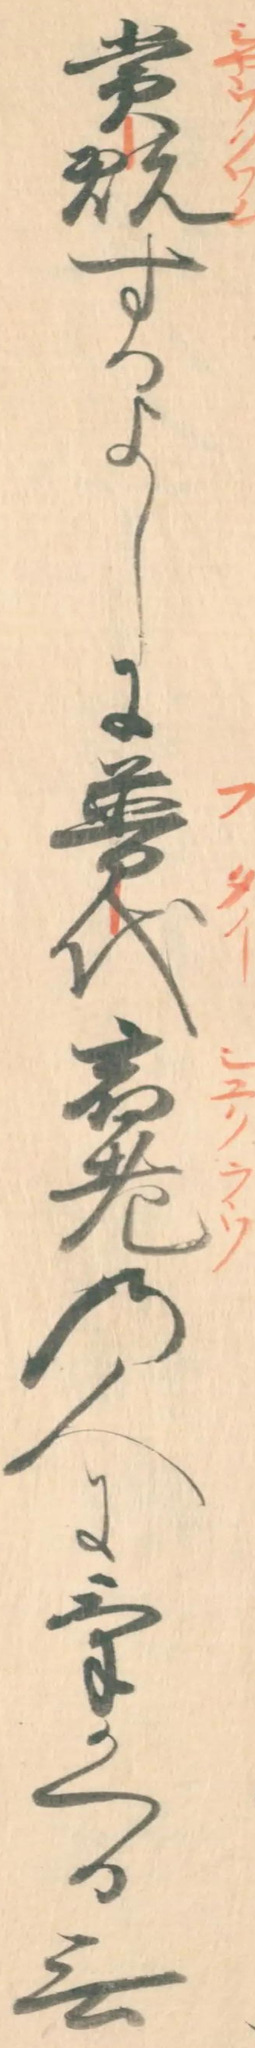賞翫するよしに普代の宿老の人にかけへる無
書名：遊庭秘抄 2巻. [1]
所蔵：国立国会図書館 National Diet Library, JAPAN
